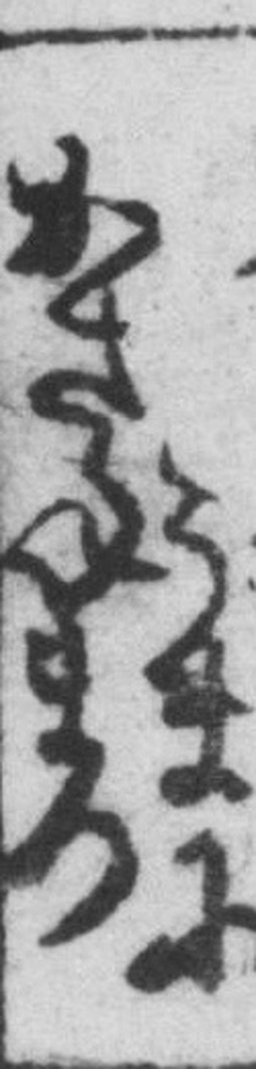かさねまつ
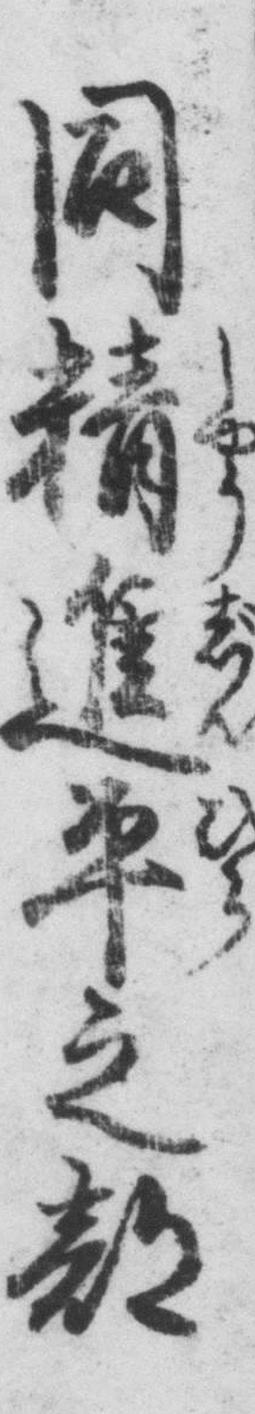同精進平之部
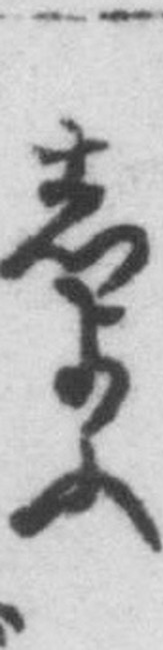ちよふ
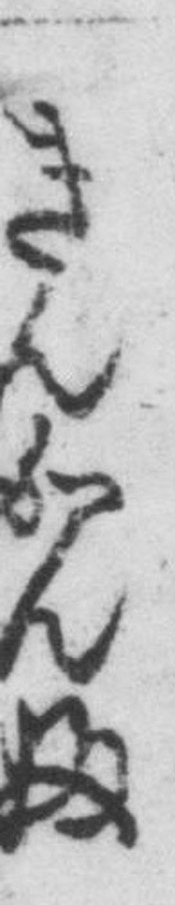きんかんふ
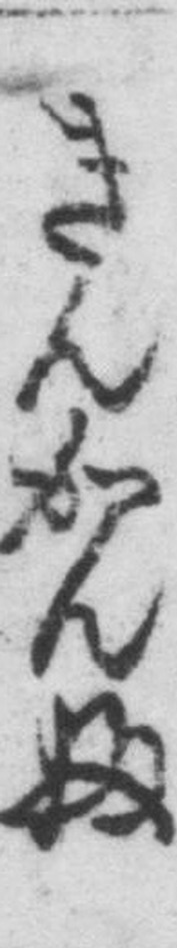きんかんふ
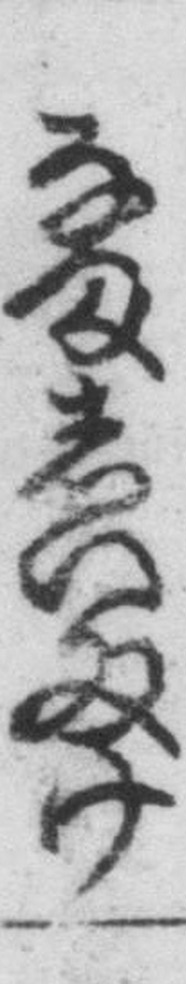なましいたけび
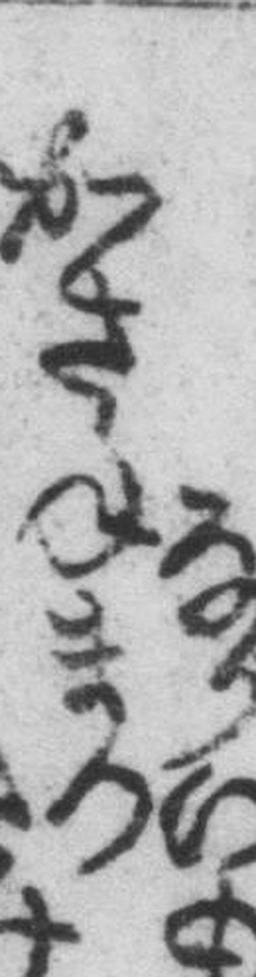かさねまつ
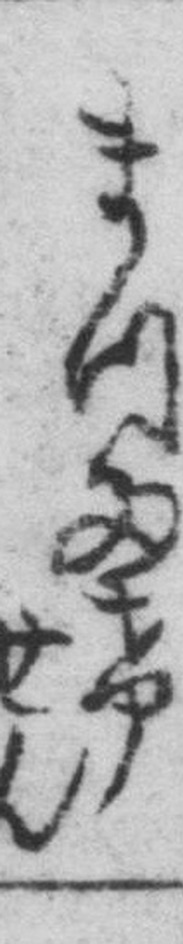新つとせん
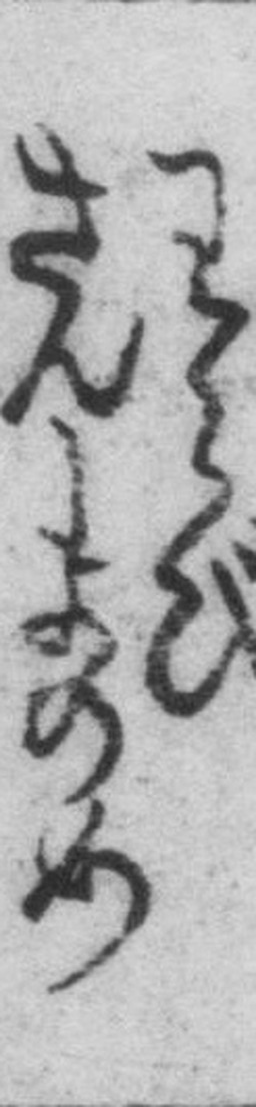さんしよのめ
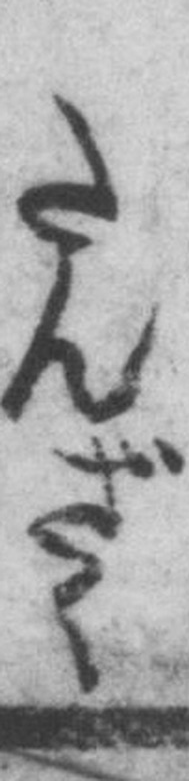たんざく

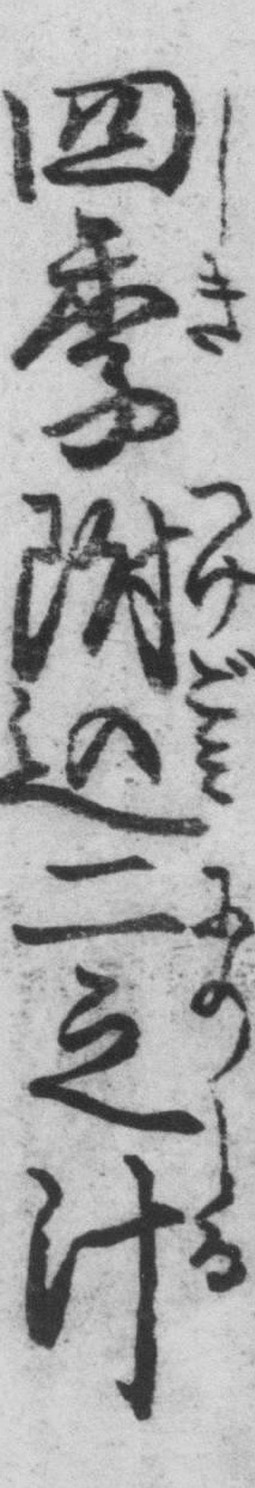四季附込二之汁
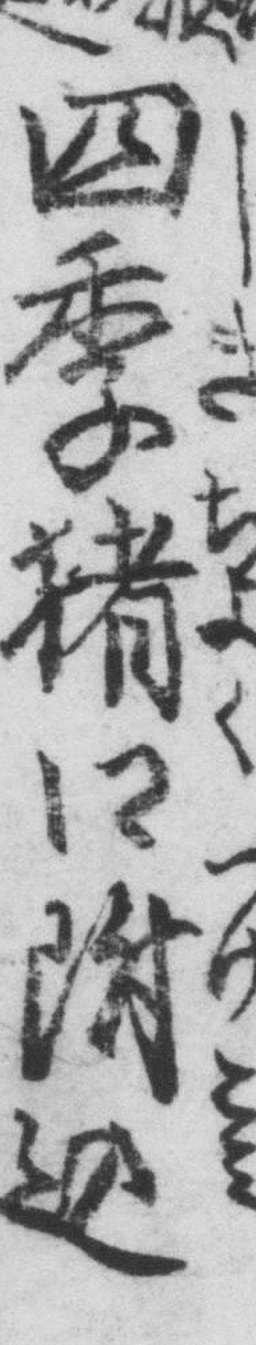四季猪口附込
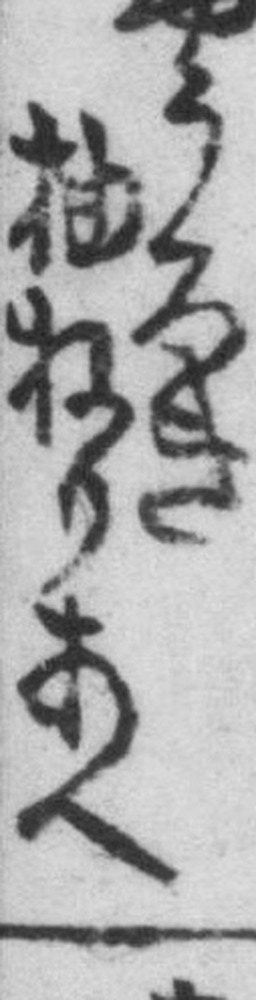柚ねりあへ
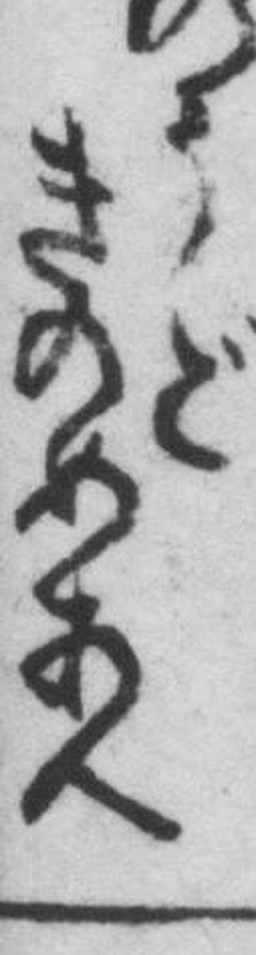きのめあへ
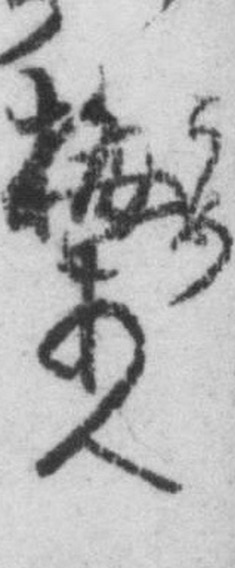梅あへ
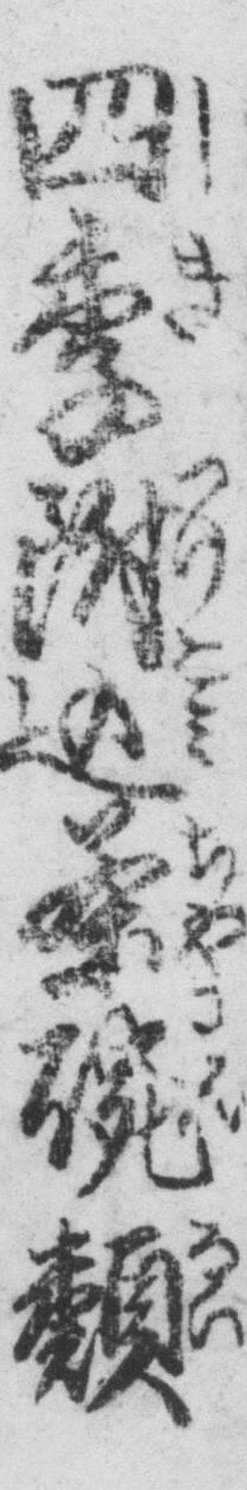四季附込茶碗類
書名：即席庖丁
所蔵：大阪府立大学学術情報センター 国文学研究資料館
